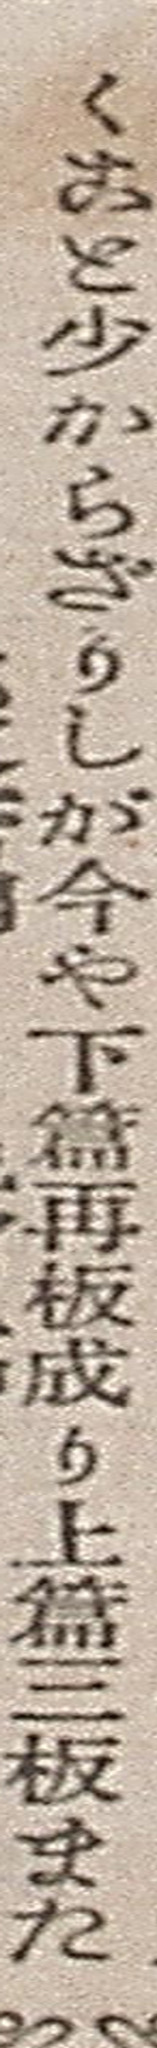くこと少からざりしが今や下編再板成り上編三板また
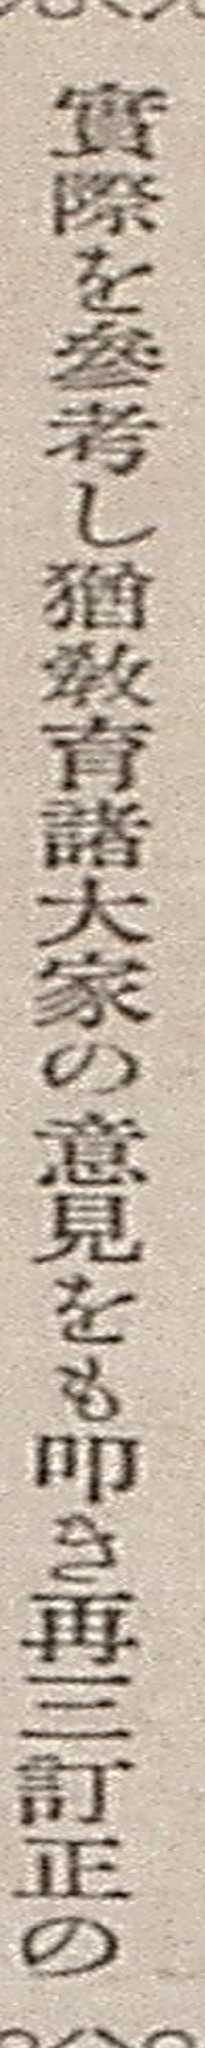実際を参考し猶教育諸大家の意見をも叩き再三訂正の
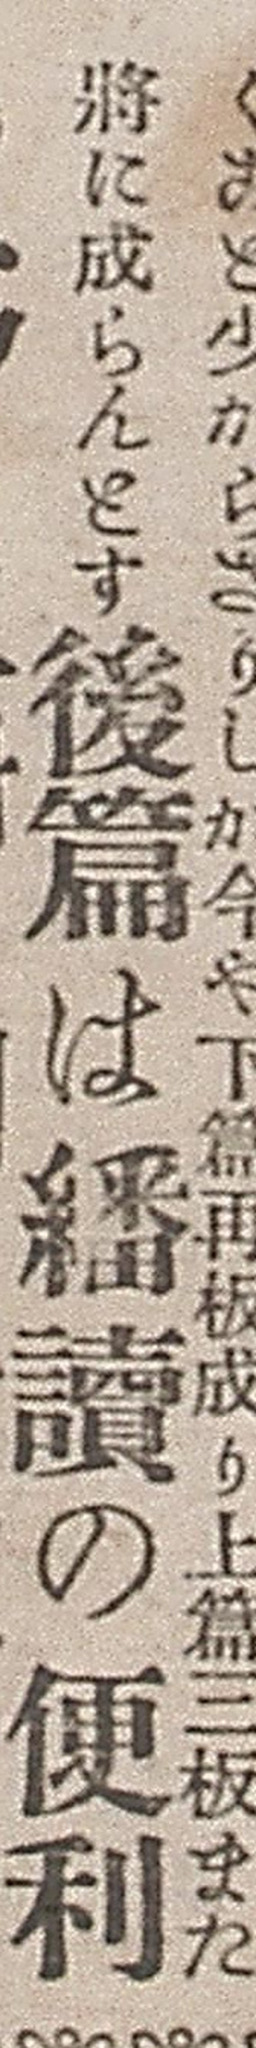将に成らんとす後編は繙読の便利
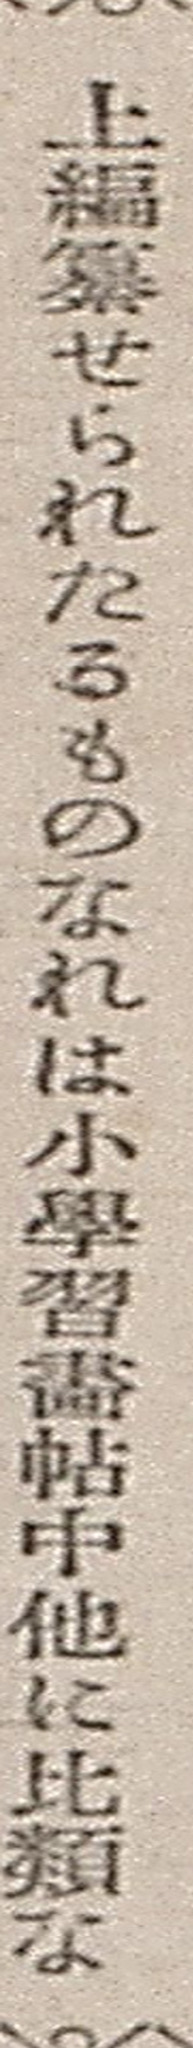上編纂せられたるものなれは小学習画帖中他に比類な
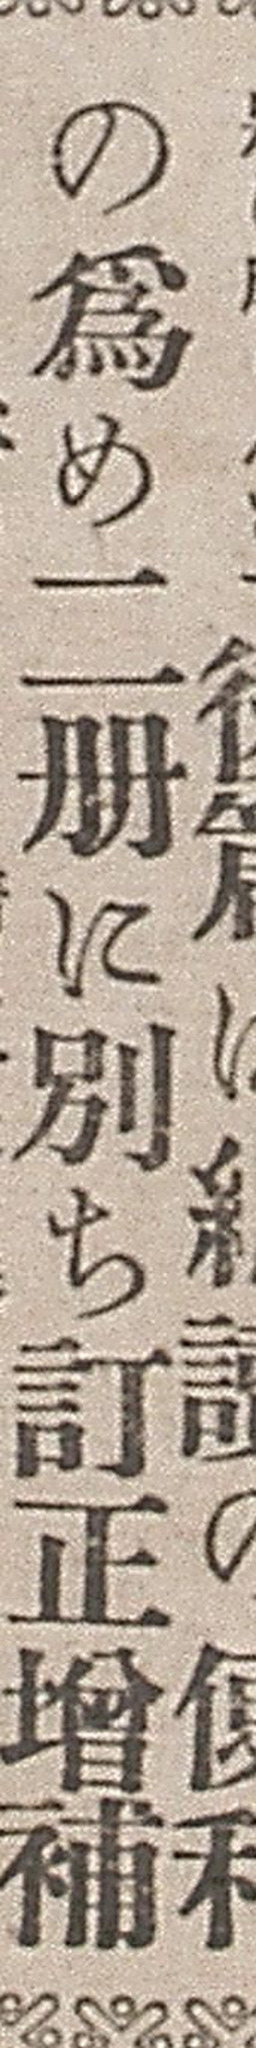の為め二冊に別ち訂正増補
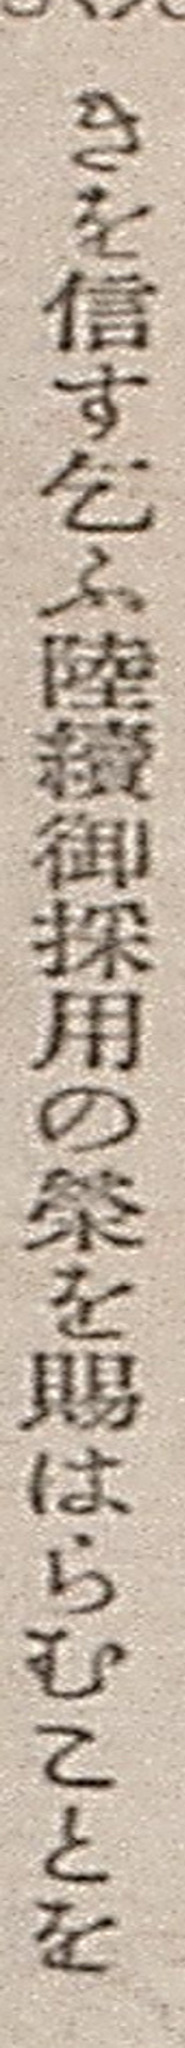きを信す乞ふ陸続御採用の栄を賜はらむことを
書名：風俗畫報臨時増刊第百二十四號　洪水地震被害録（上）
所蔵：東京大学地震研究所図書室 Earthquake Research Institute Library, The University of Tokyo, JAPAN
